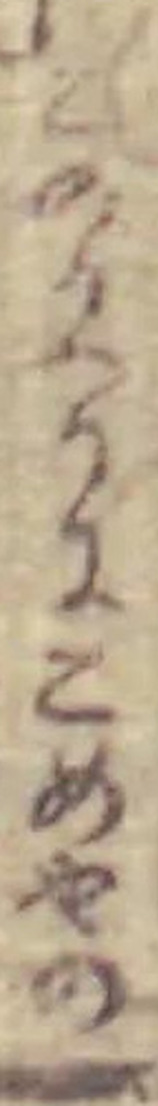このかへりにこめやの
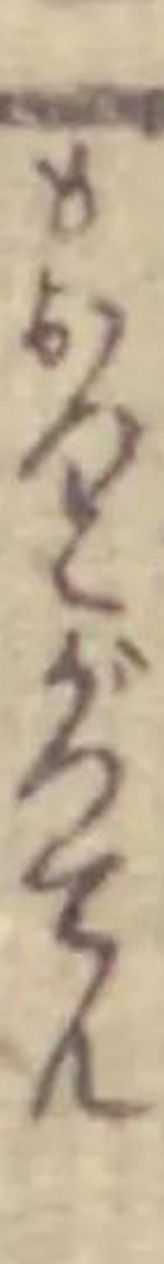もおつとがつてん
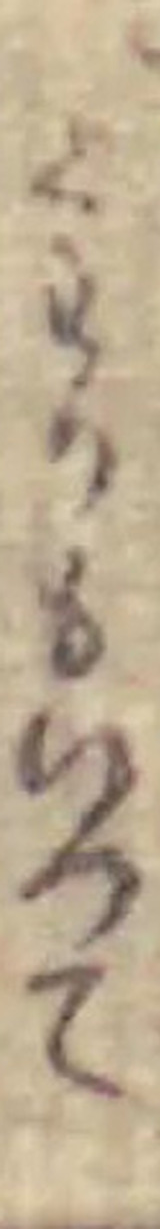とわりもいつて
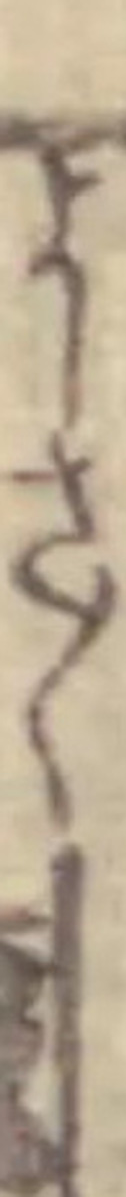よしさ〳〵
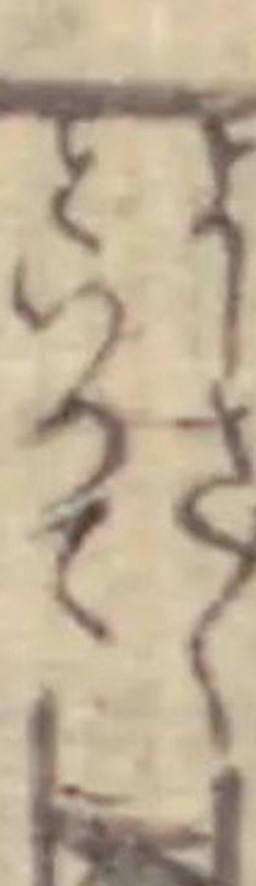といつて
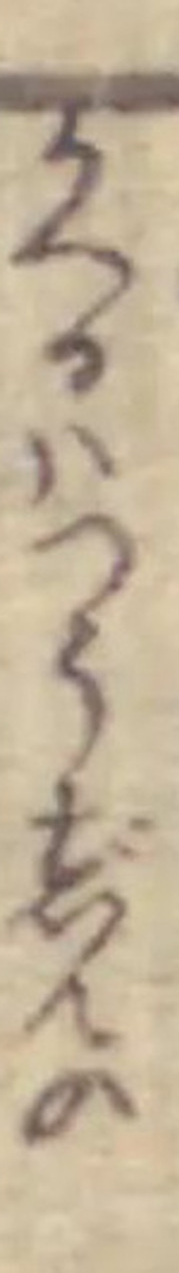かへるはつうじんの
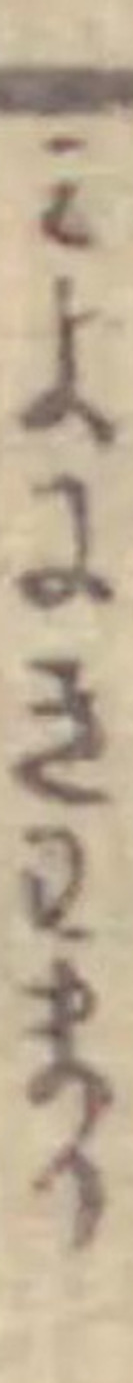みよにきわまり
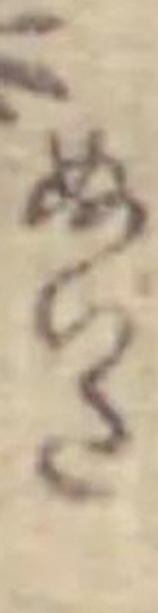ぬいた
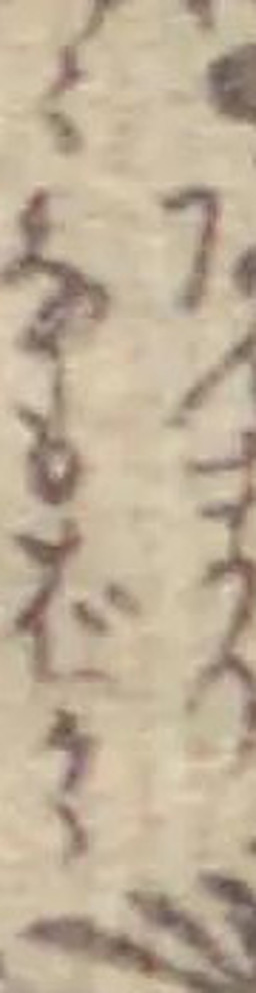つうなもばから
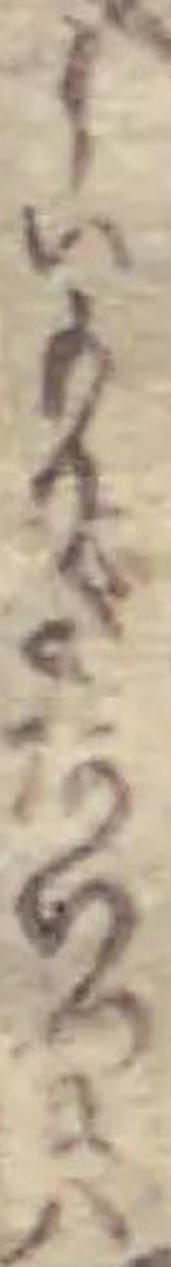しいもんだあいつには

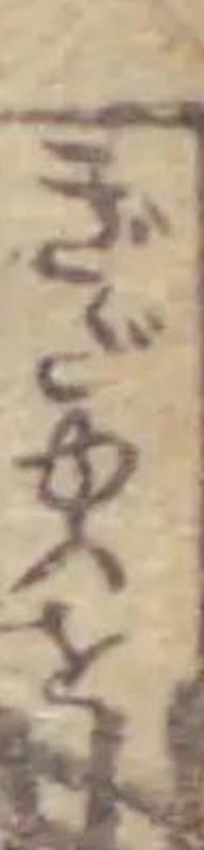ぎだゆふを
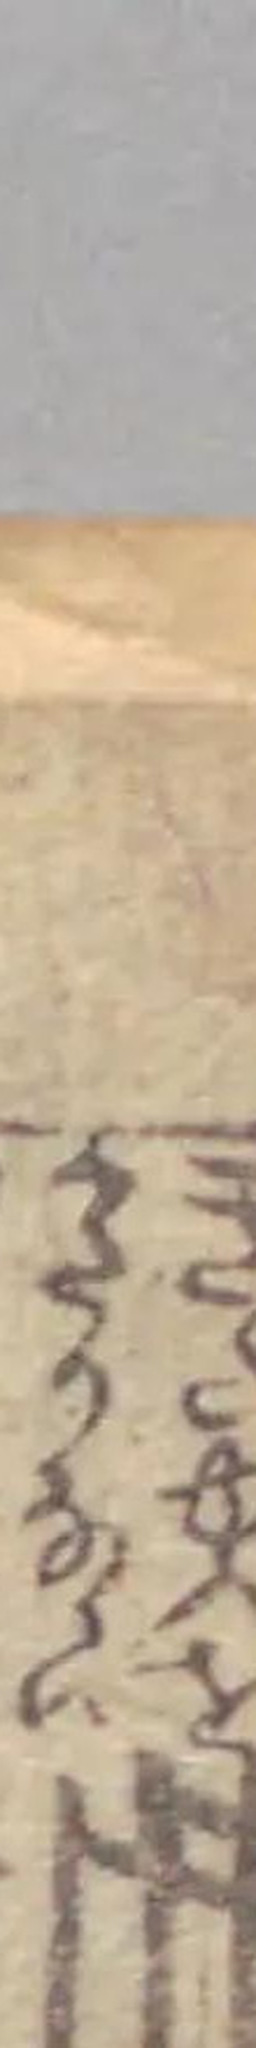かたりならい
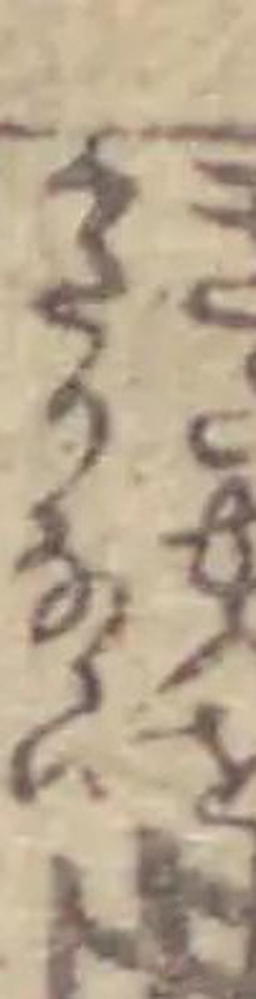かたりならい
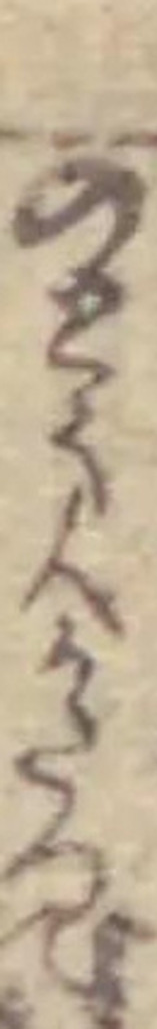のとう人かたつて
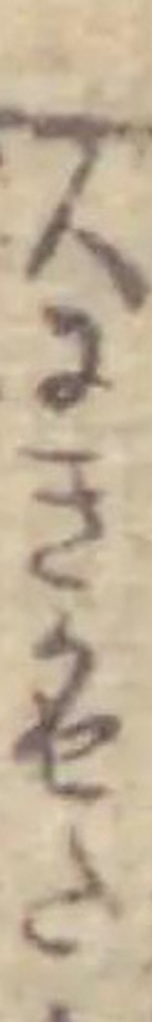人にきかせた
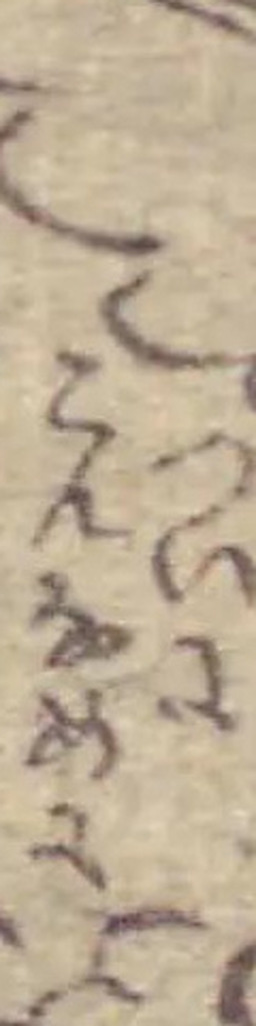こんなめに
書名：茶羅毛通人 3巻
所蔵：国立国会図書館 National Diet Library, JAPAN
